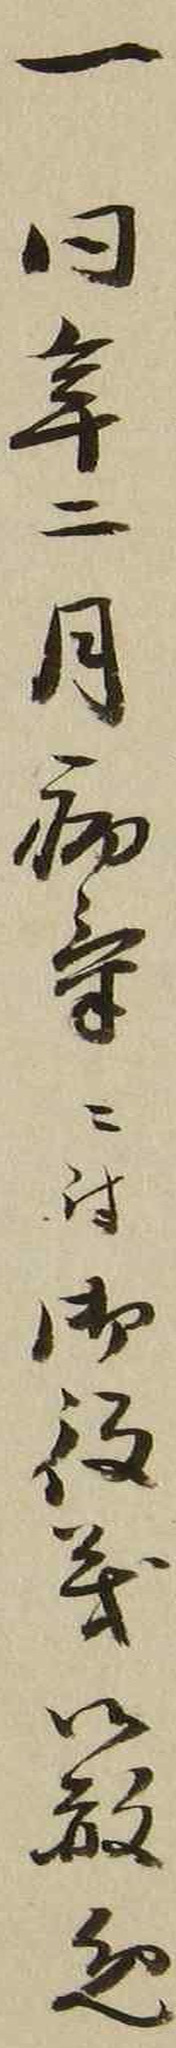一同年二月病気に付御役義御赦免
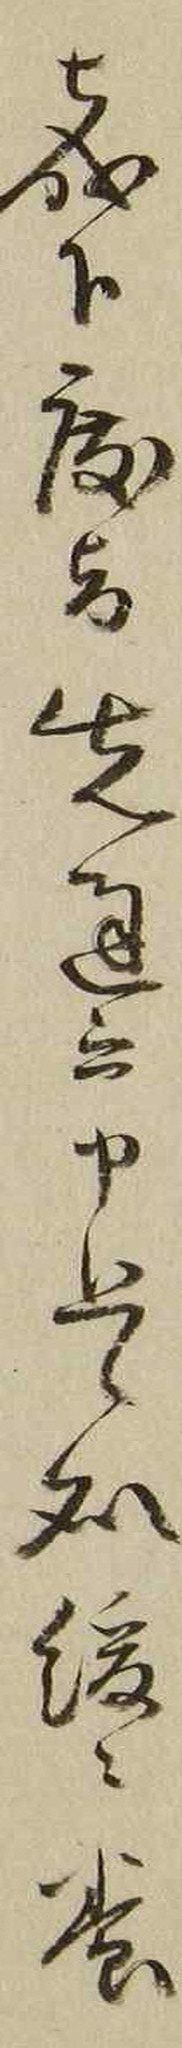被成下度旨先達而申上候処緩々養
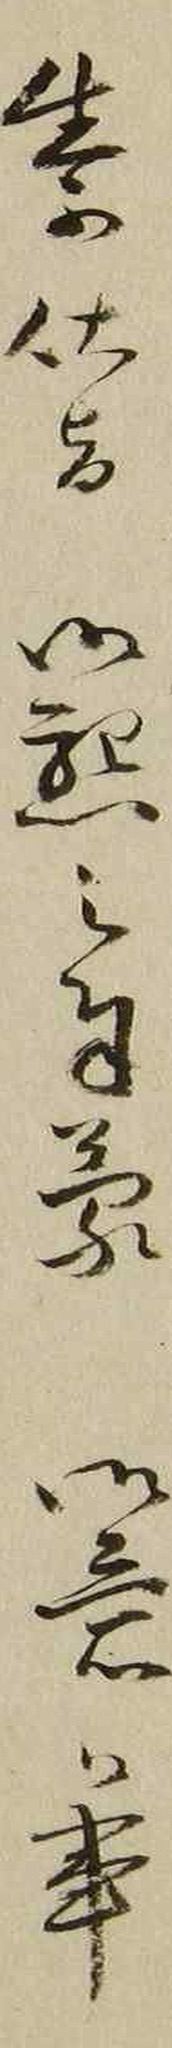生可仕旨御懇之奉蒙御意候事
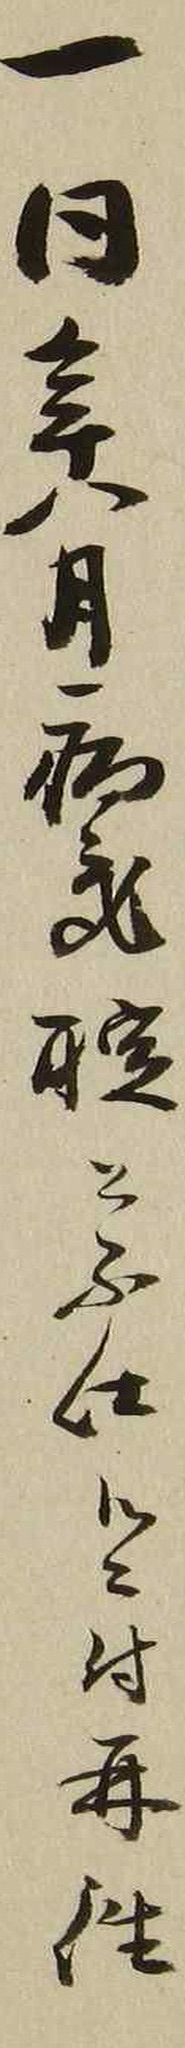一同年八月病気聢と不仕候に付再応
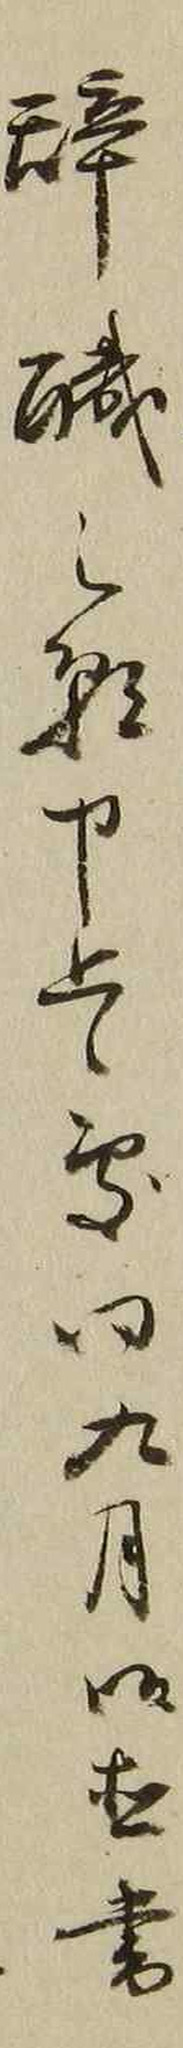辞職之願申上候処同九月御直書
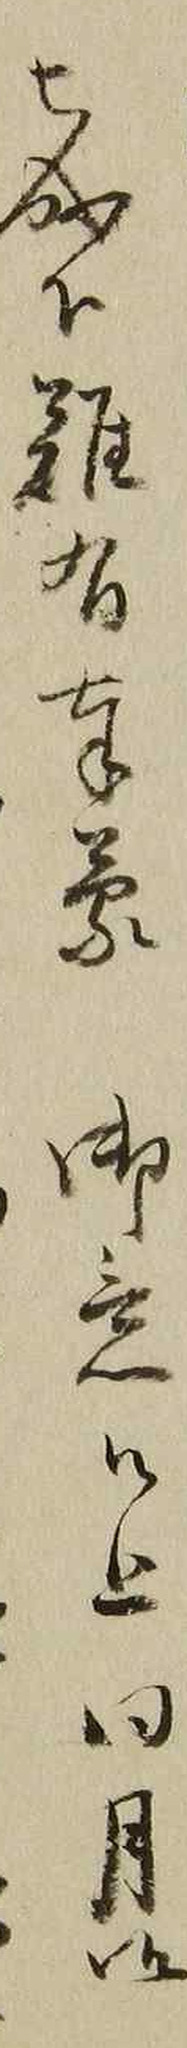被成下難有奉蒙御意候上同月御
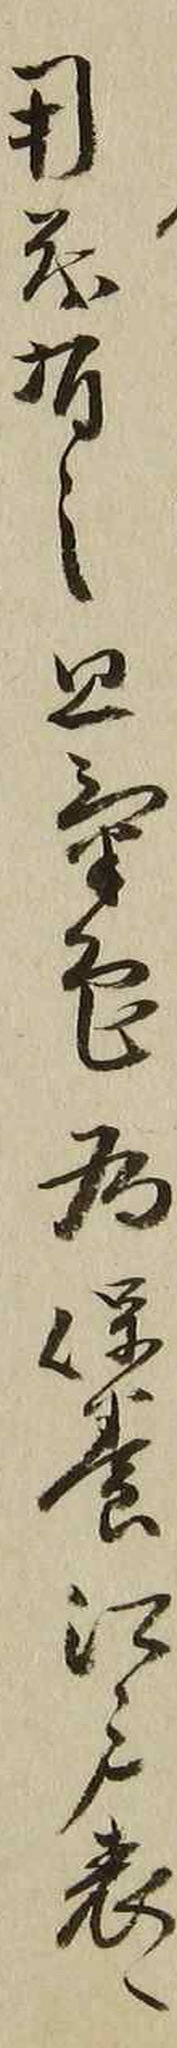用も有之且気色為保養江戸表へ
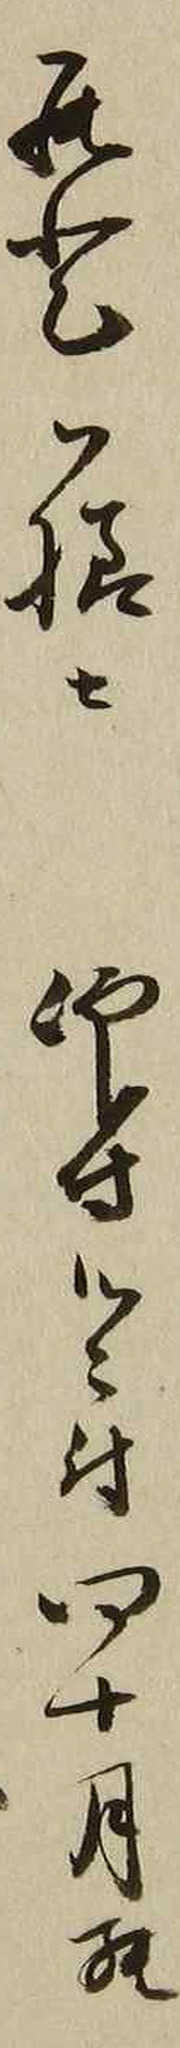罷登候様被仰付候に付同十月罷
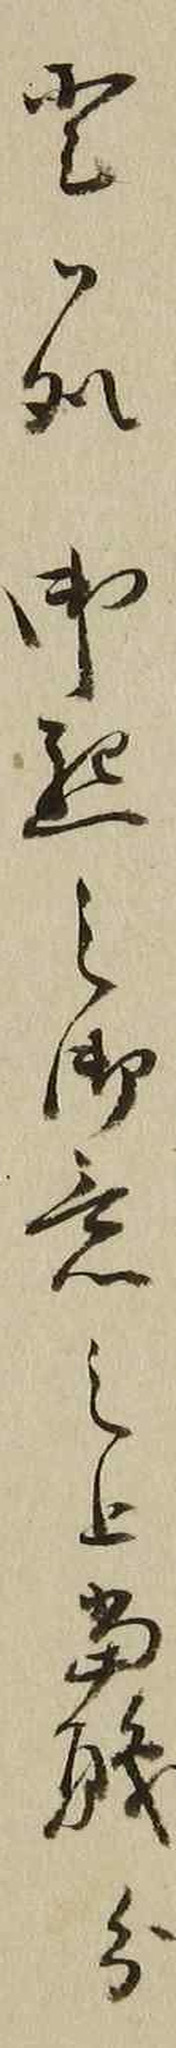登候処御懇之御意之上当職分
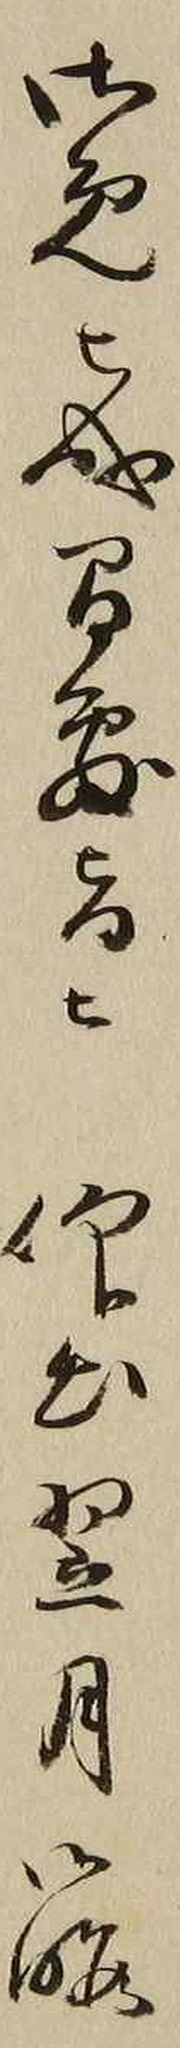御免被成間敷旨被仰出翌月御暇
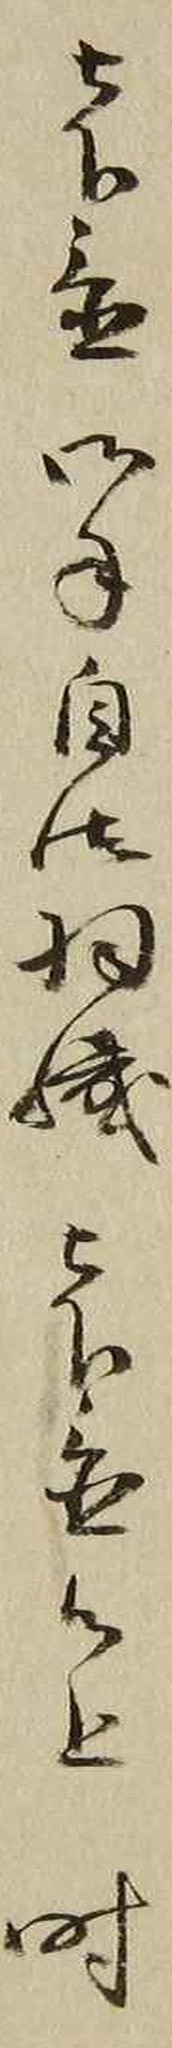被下置御手自御羽織被下置候上時
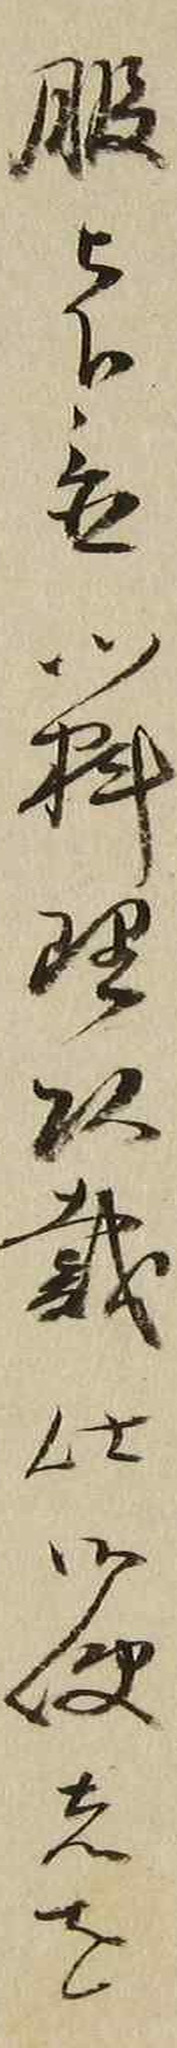服被下置御料理頂戴仕御使者を
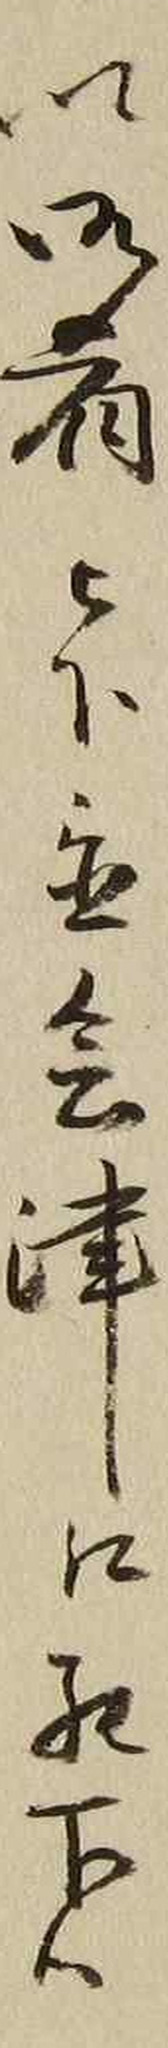以御肴被下置会津へ罷下候
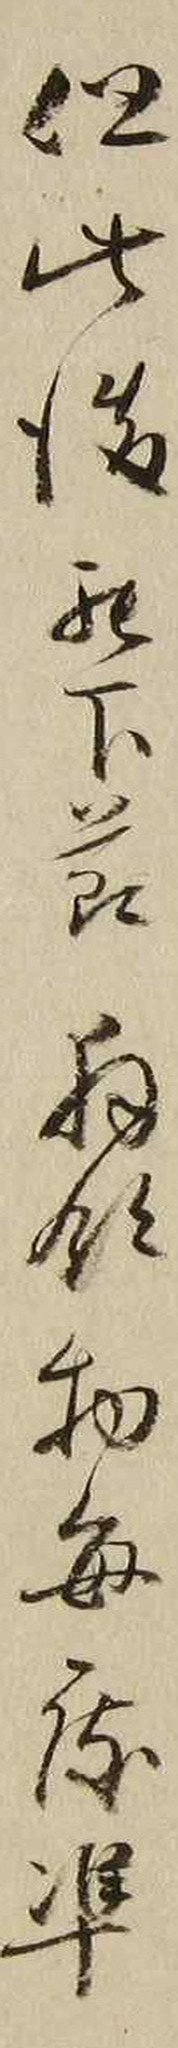但此後罷下節拝領物毎度準
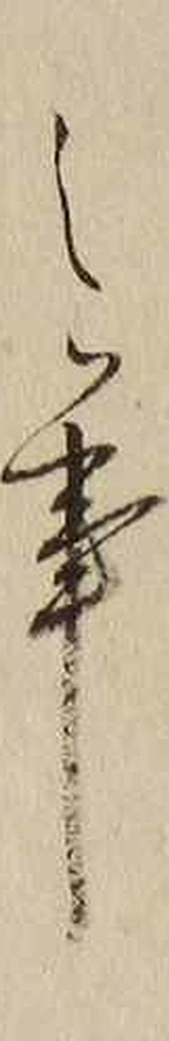之候事
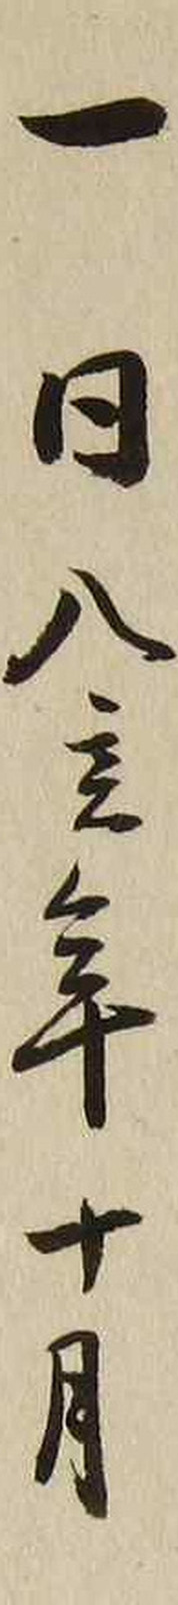一同八亥年十月
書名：諸士系譜　巻之269　さ之部1
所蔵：会津若松市立会津図書館
